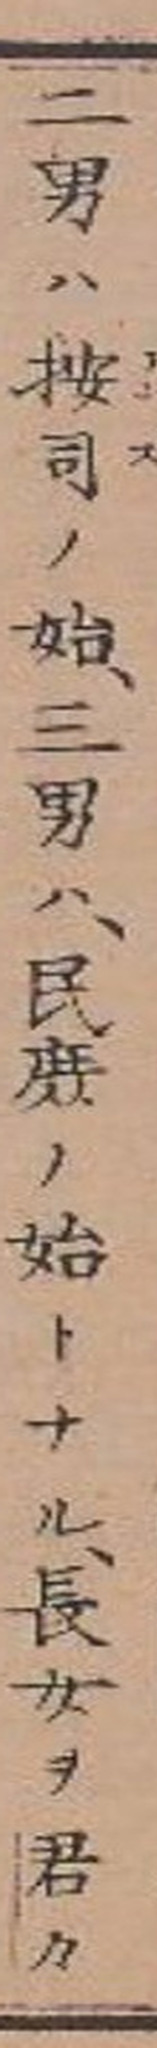二男ハ按司ノ始、三男ハ、民庶ノ始トナル、長女ヲ君々
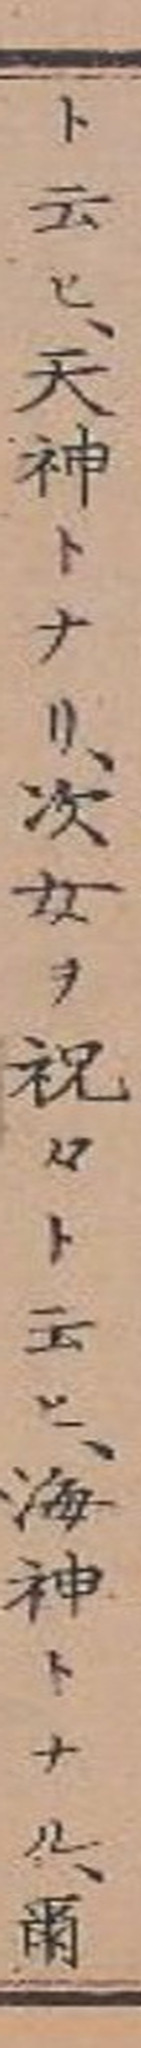ト云ヒ、天神トナリ、次女ヲ祝々ト云ヒ、海神トナル、爾
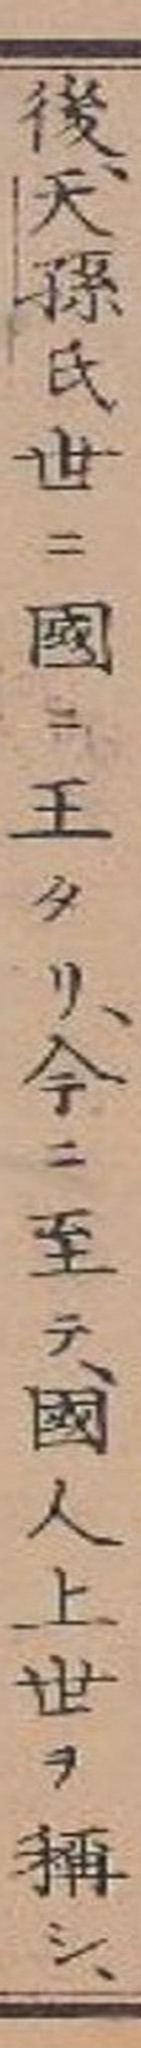後、天孫氏世ニ国ニ王タリ、今ニ至テ、国人上世ヲ称シ、
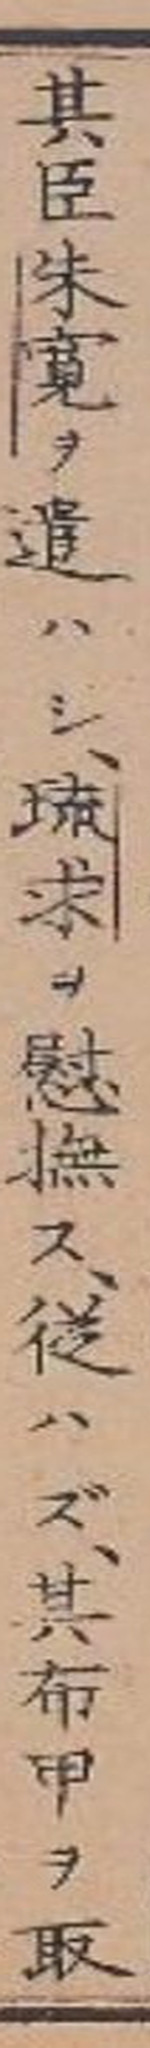其臣朱寛ヲ遣ハシ、琉求ヲ慰撫ス、従ハズ、其布甲ヲ取
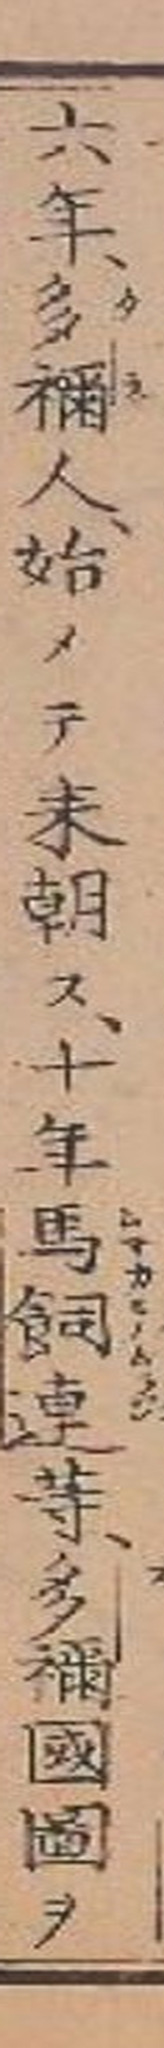六年、多禰人、始メテ来朝ス、十年馬飼連等、多禰国図ヲ
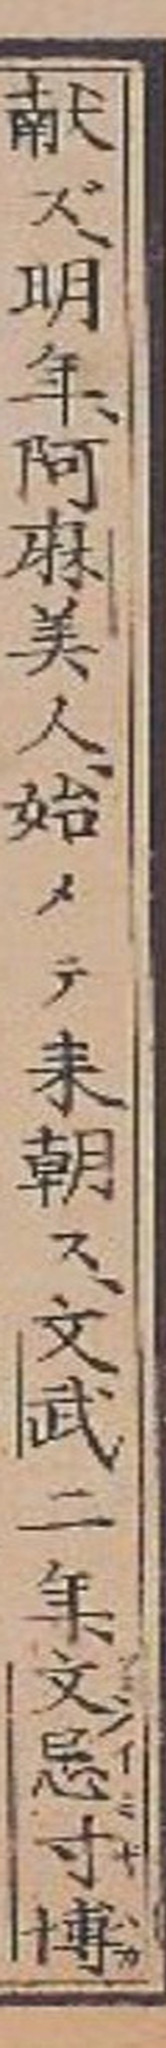献ズ、明年、阿麻美人、始メテ来朝ス、文武二年、文忌寸博
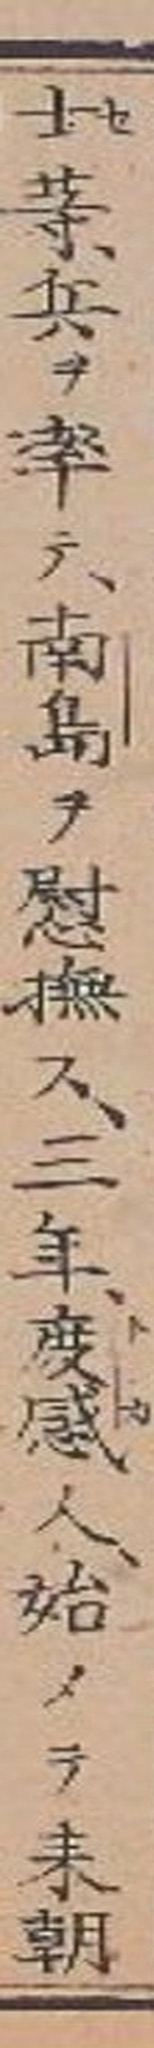士等、兵ヲ率テ、南島ヲ慰撫ス、三年、度感人、始メテ来朝
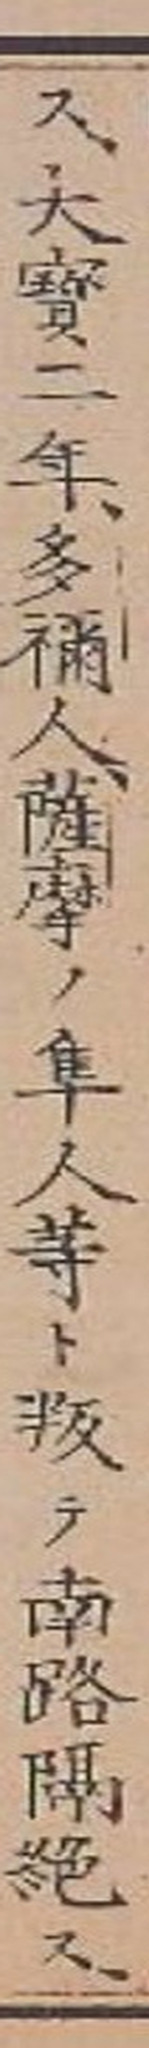ス、大宝二年、多禰人、薩摩ノ隼人等ト叛テ南路隔絶ス、
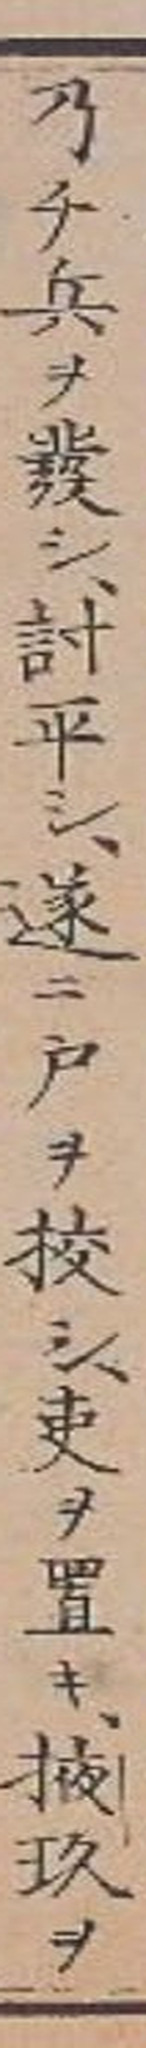乃チ兵ヲ発シ、討平シ、遂ニ戸ヲ校シ、吏ヲ置キ、掖玖ヲ
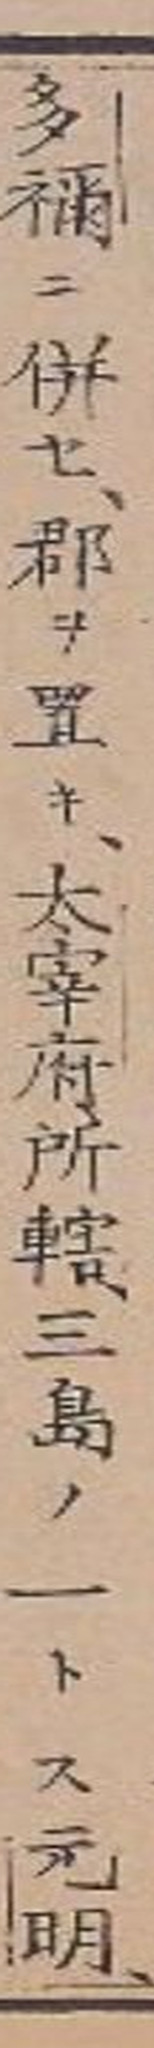多禰ニ併セ、郡ヲ置キ、太宰府所轄、三島ノ一トス元明、
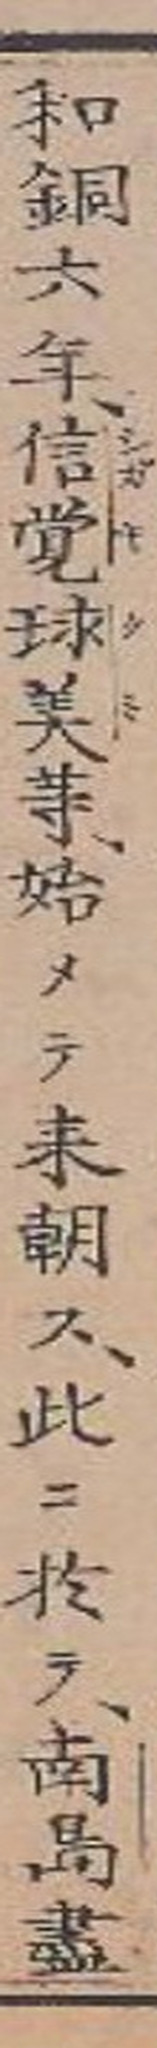和銅六年、信覚球美等、始メテ来朝ス、此ニ於テ、南島尽
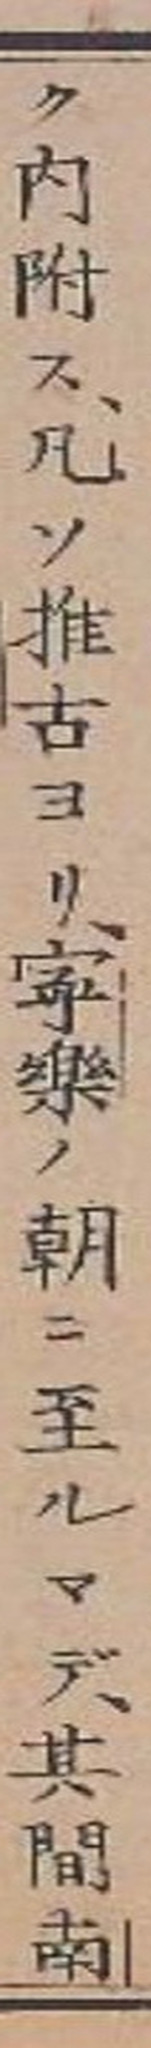ク内附ス、凡ソ推古ヨリ、寧楽ノ朝ニ至ルマデ、其間南
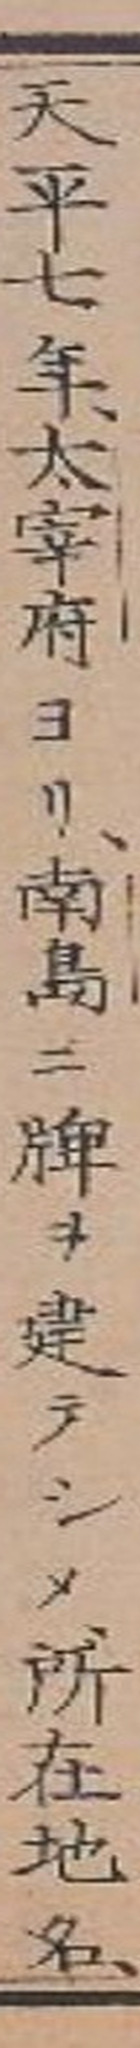天平七年、太宰府ヨリ、南島ニ牌ヲ建テシメ、所在地名、
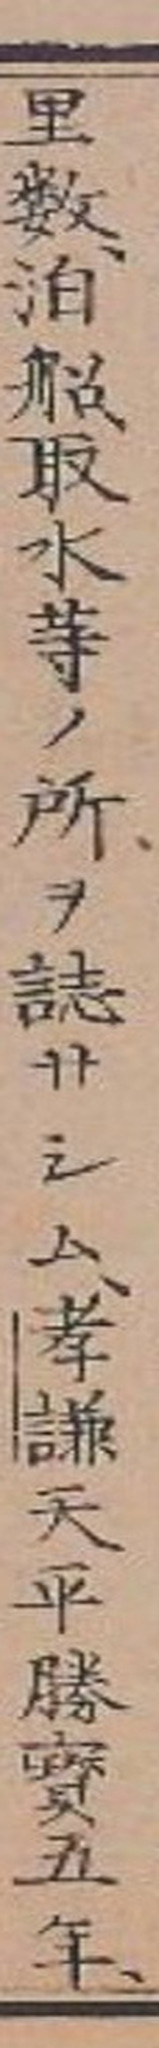里数、泊船、取水等ノ所ヲ誌サシム、孝謙天平勝宝五年、
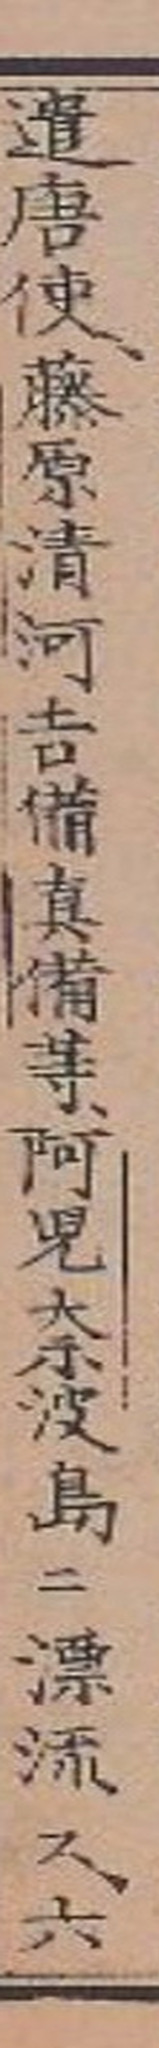遣唐使、藤原清河吉備真備等、阿児奈波島ニ漂流ス、六

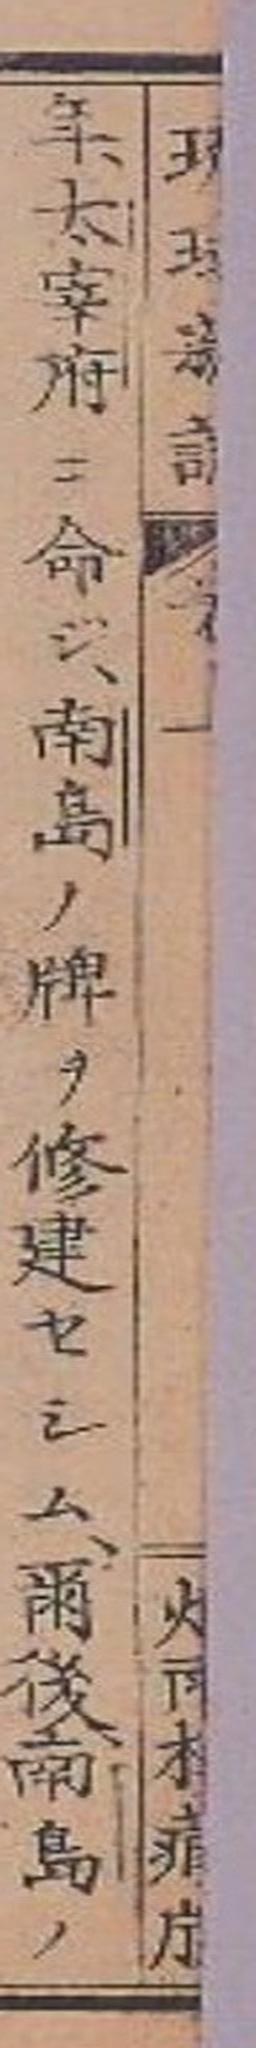年、太宰府ニ命ジ、南島ノ牌ヲ修建セシム、爾後、南島ノ
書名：琉球新誌 巻上
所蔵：University of the Ryukyus Library
